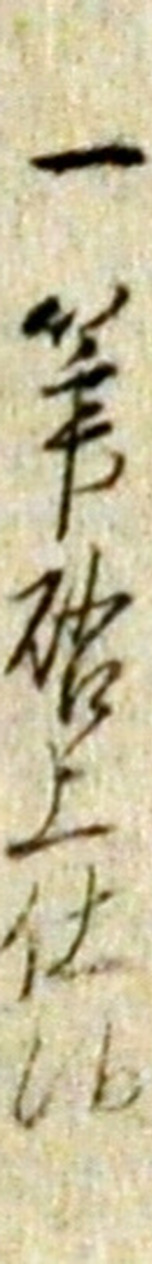一筆啓上仕候
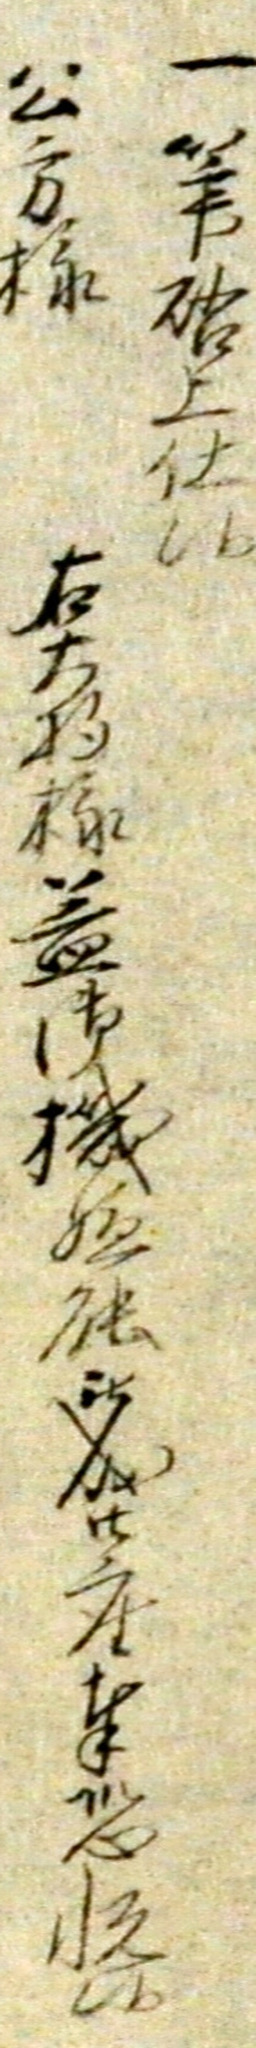公方様右大将様益御機嫌能被成御座奉恐悦候
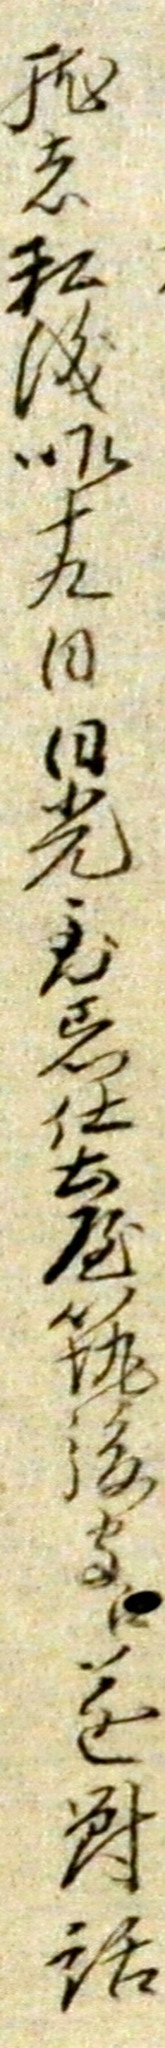然者私儀昨十九日日光到着仕土屋筑後守江遂対話
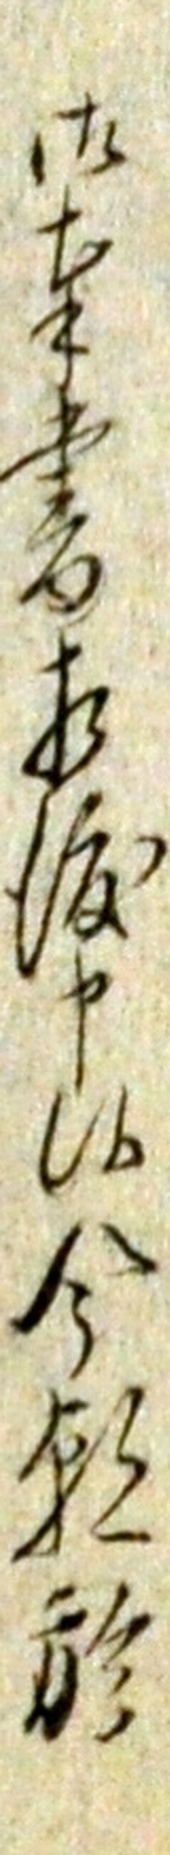御奉書相渡申候今朝於
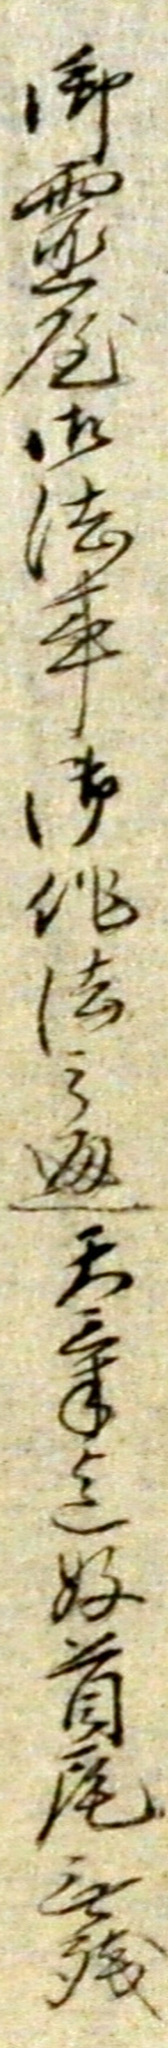御霊屋御法事御作法之通天気迄好首尾無残
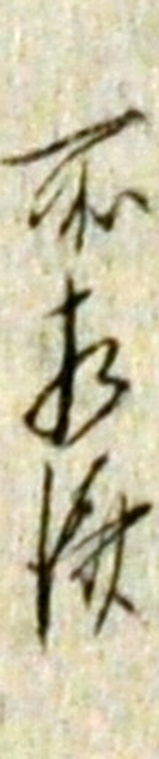所相済
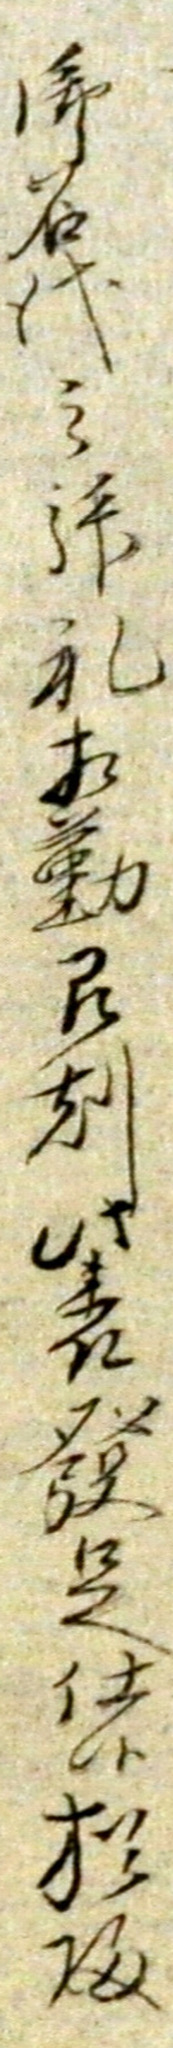御名代之拝礼相勤即刻此表発足仕候猶帰
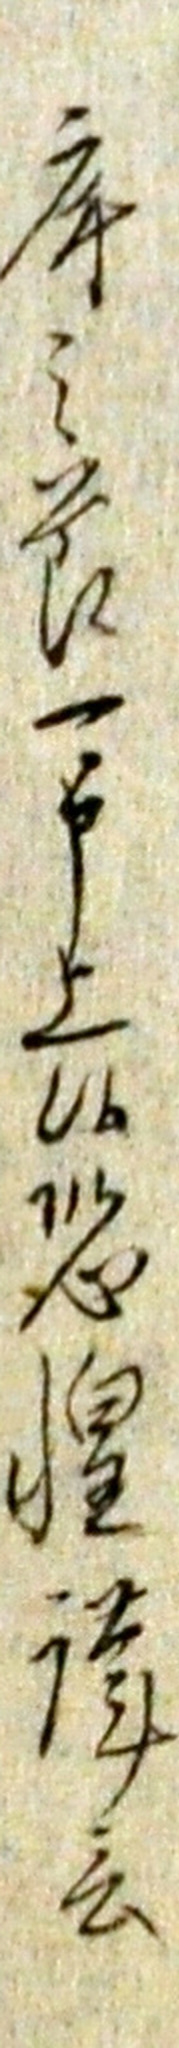序之節可申上候恐惶謹言
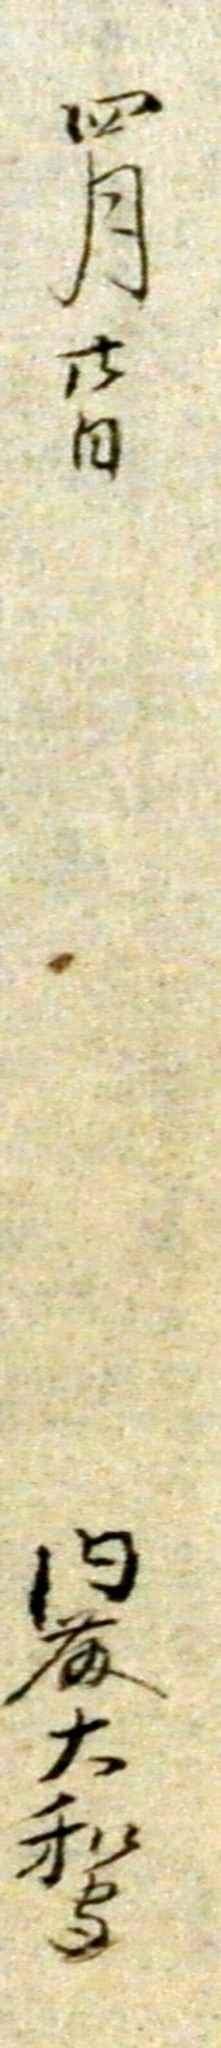四月廿日内藤大和守
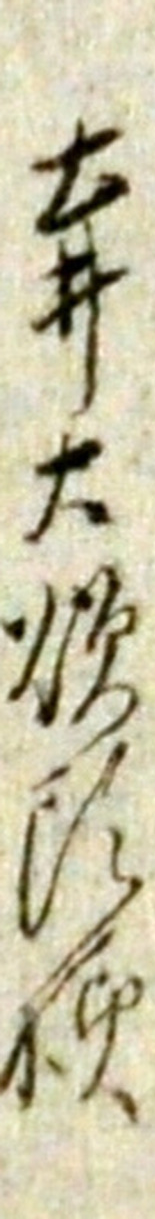土井大炊頭様
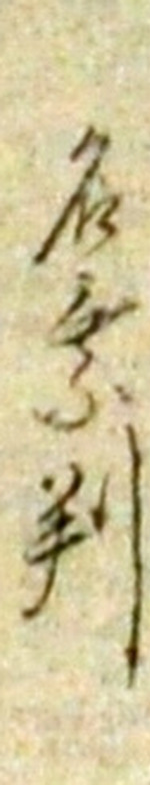名乗判
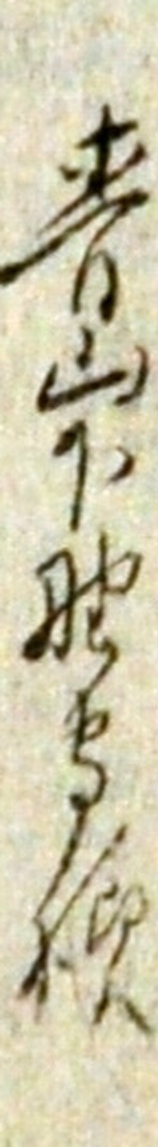青山下野守様
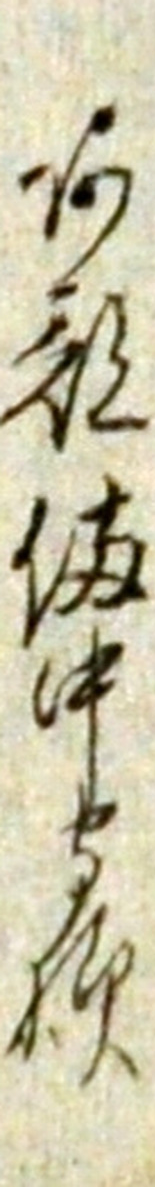阿部備中守様
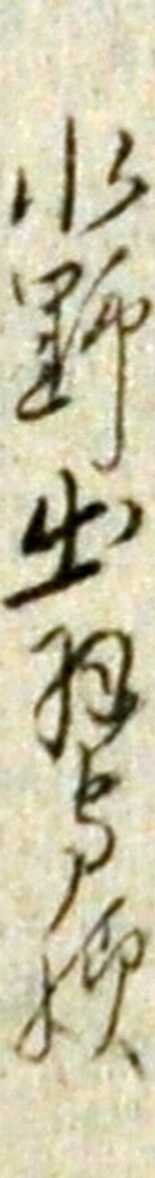水野出羽守様
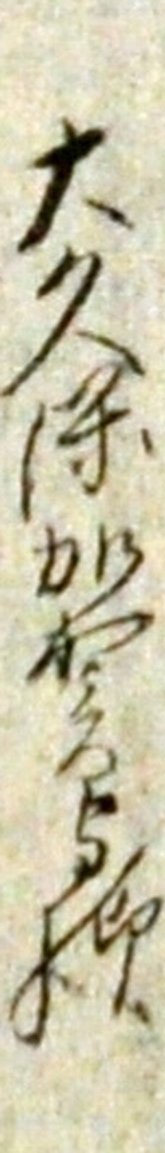大久保加賀守様
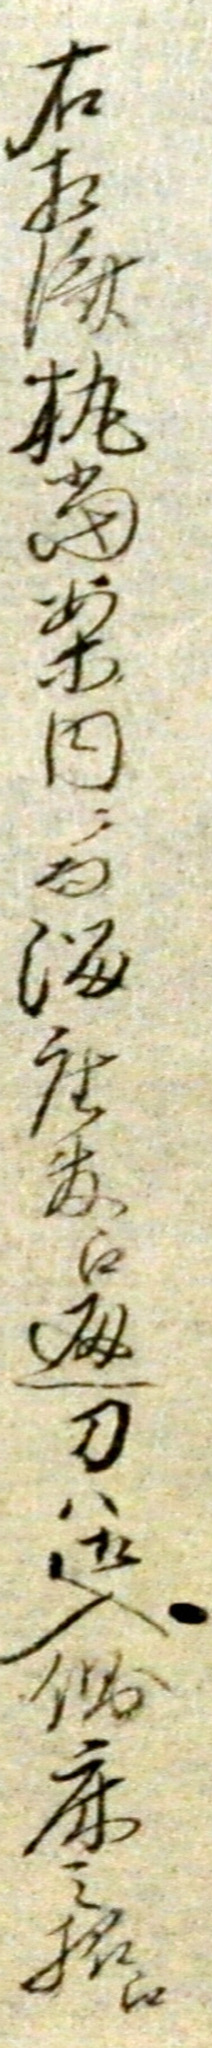右相済執當案内ニ而溜座敷江通刀ㇵ御入側床之脇江
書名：日光御名代相勤候節ノ留
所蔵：伊那市立高遠町図書館・合同会社AMANE
